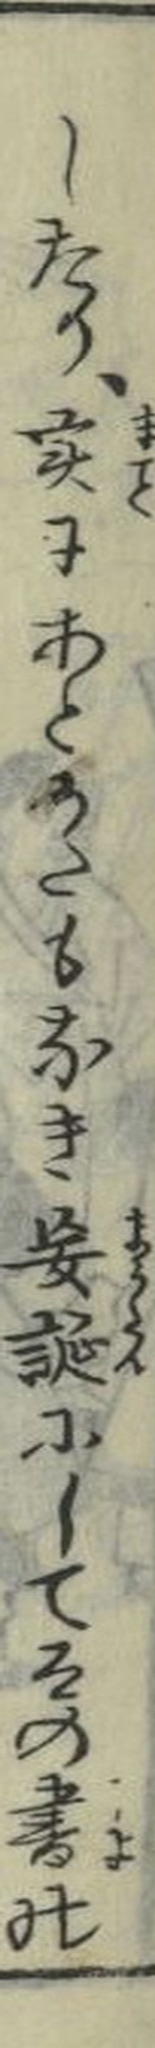したり、実にあとかたもなき妄誕にしてその書の
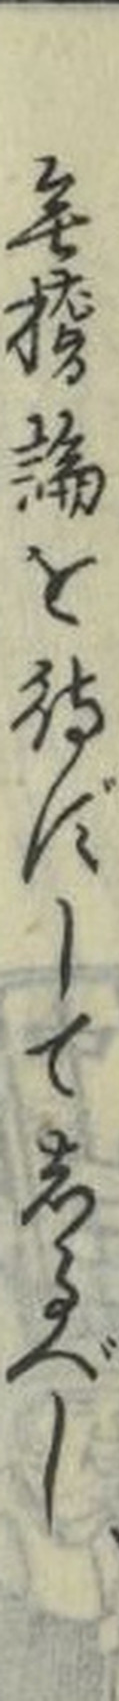無稽論を待ずしてしるべし、
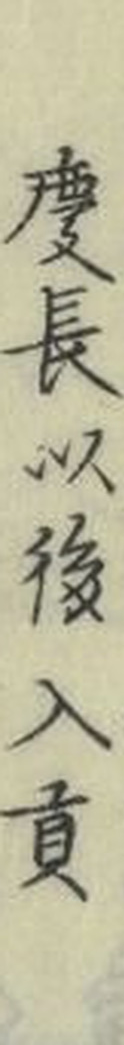慶長以後入貢
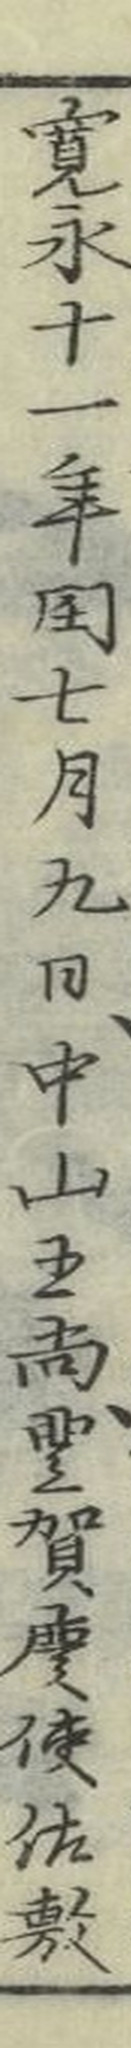寛永十一年閏七月九日、中山王尚、豊賀慶使佐敷
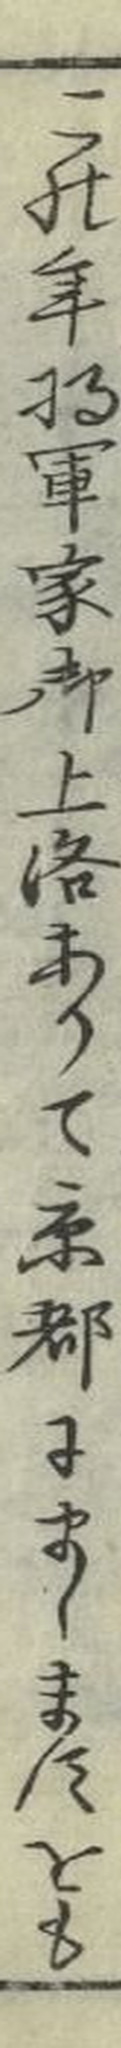この年将軍家御上洛ありて、京都にましますをも
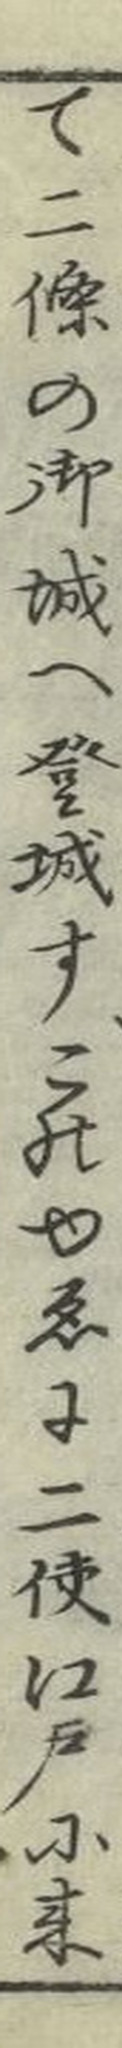て、二条の御城へ登城す、このゆゑに二使江戸に来
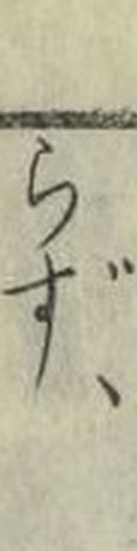らず、
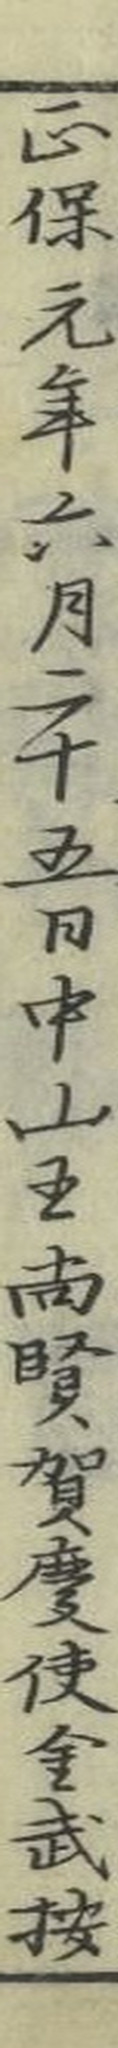正保元年六月二十五日、中山王尚賢、賀慶使金武按

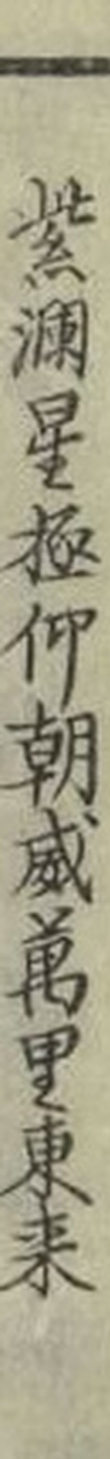紫瀾星極仲朝威万里東来
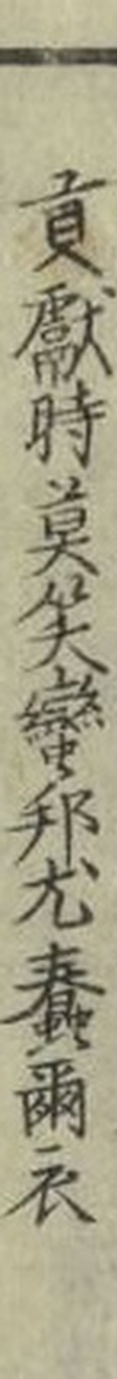貢献時莫笑蛮邦尤蠢爾衣
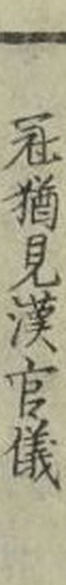冠猶見漢官儀
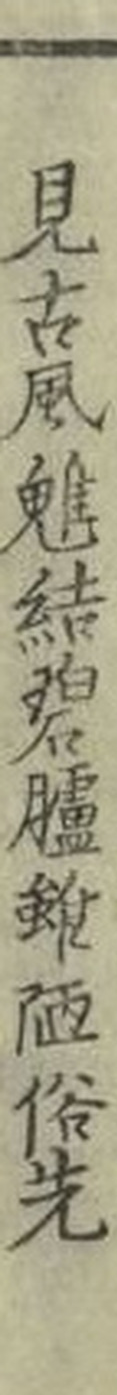見古風魋結碧臚雖陋俗先
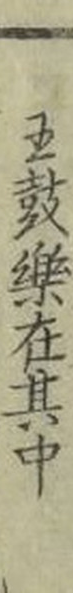王鼓楽在其中
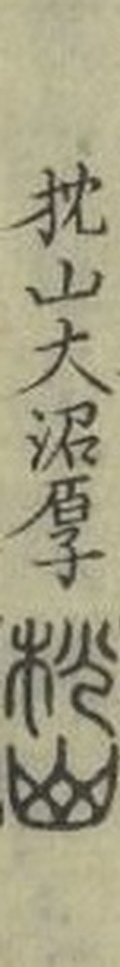枕山大沼厚
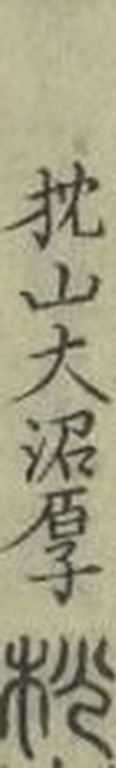枕山大沼厚

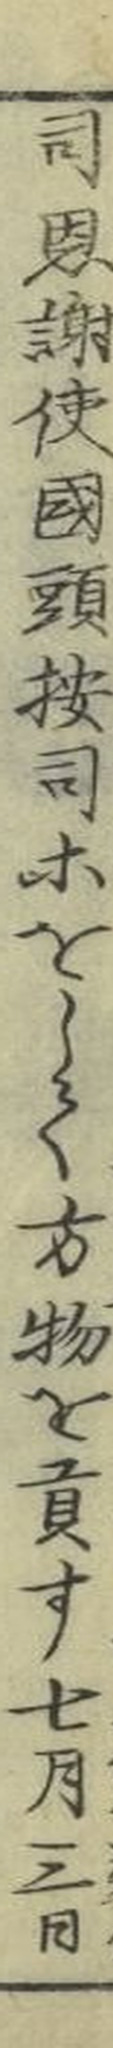司、恩謝使国頭按司等をして、方物を貢す、七月三日
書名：琉球入貢紀略
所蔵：University of the Ryukyus Library
